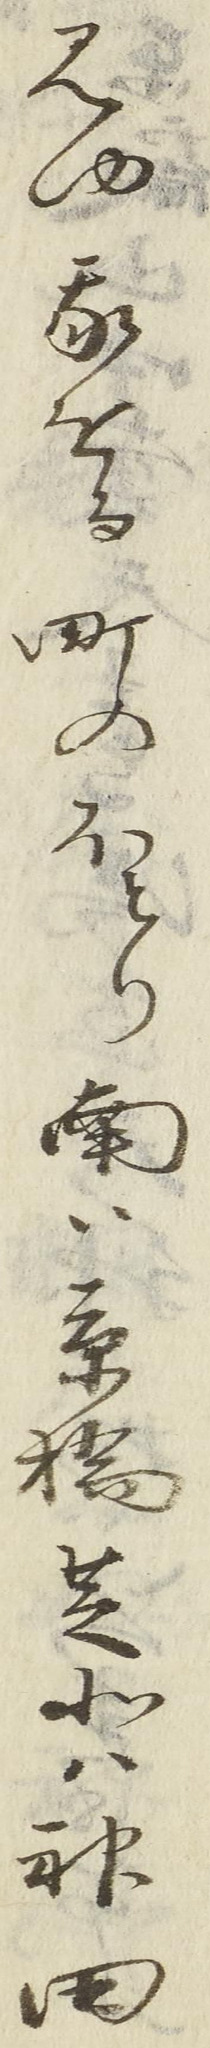見ゆ我をる町のほとり南は京橋芝北は神田
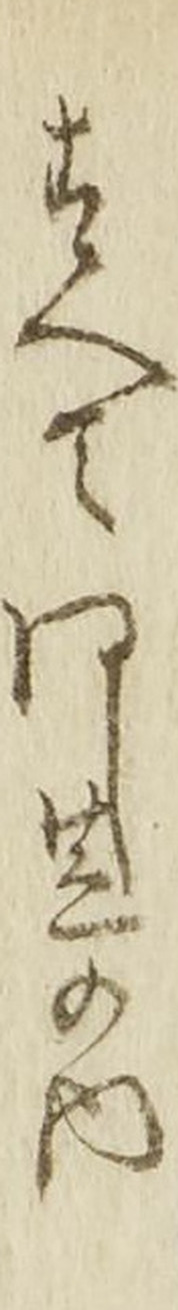すへて同し芝の内
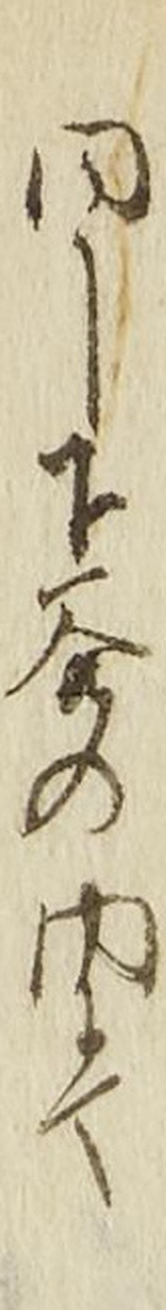同し下谷の内にて
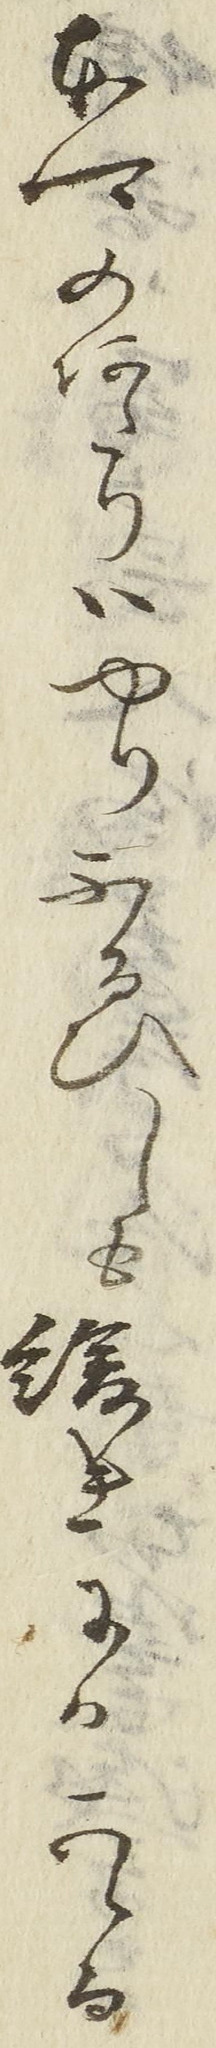本郷のあたりはゆりふるひしも緩きにかかゝる
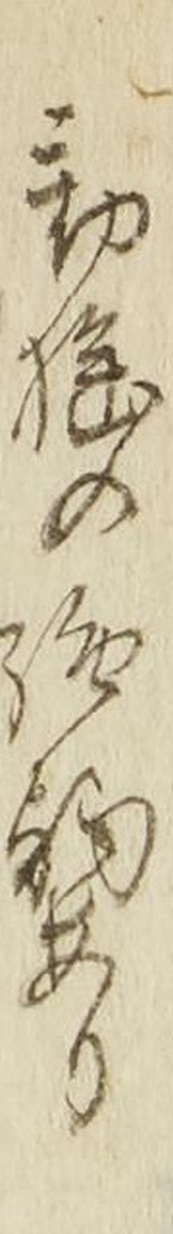動揺の強弱あり
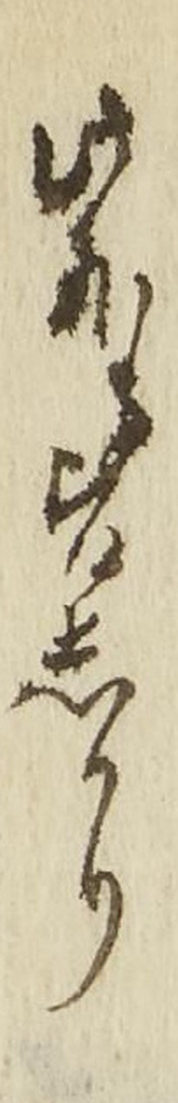此外も皆しかり
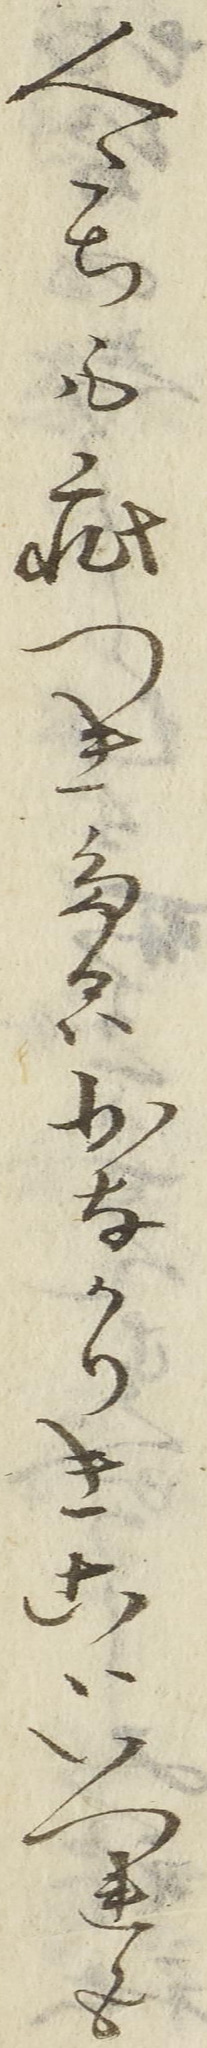人たちも疵つきたるは少なかりきこはいつれも

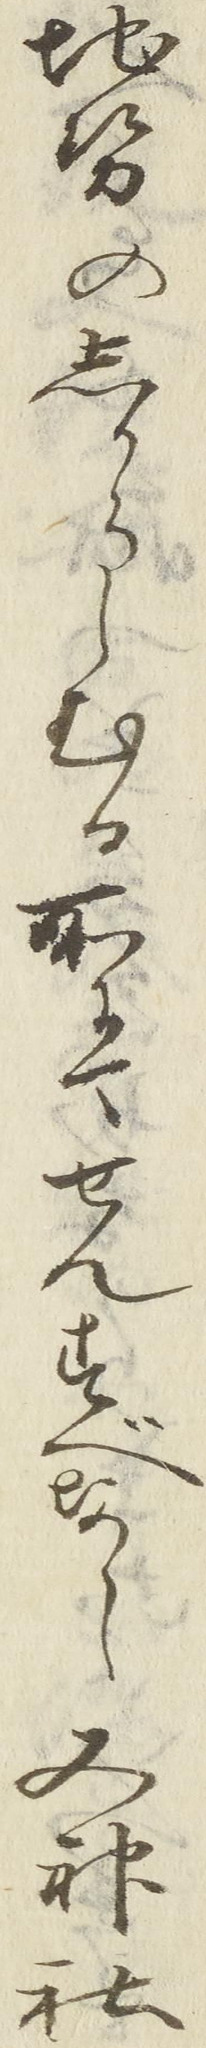地勢のしからしむる所にてせんすべなし又神社
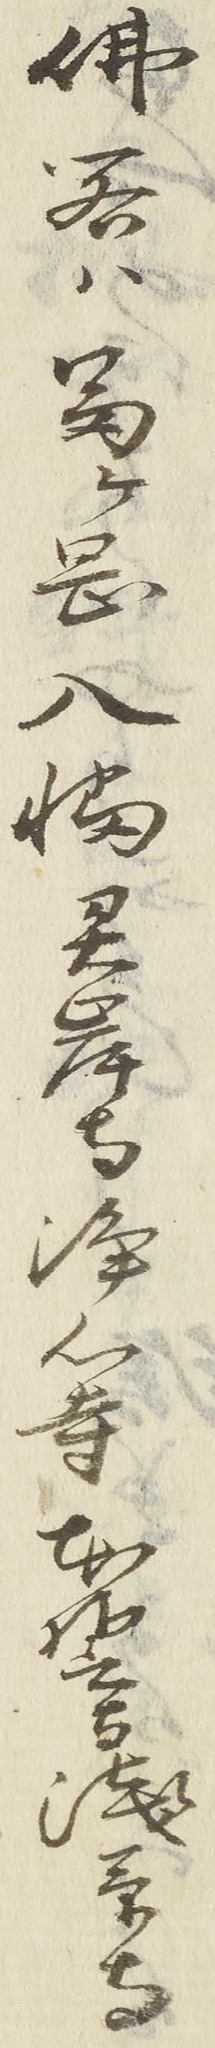仏閣は富ケ丘八幡霊岸寺浄心寺本誓寺浅草寺
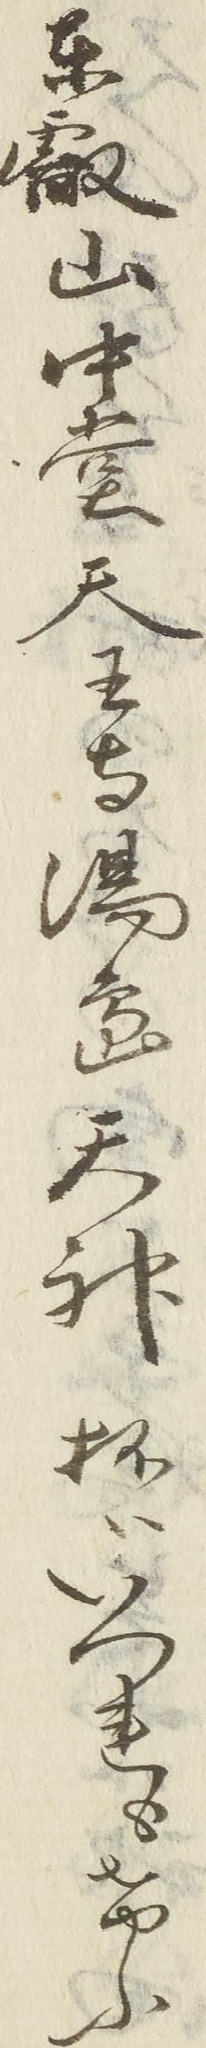東叡山中堂天王寺湯島天神抔はいつれもけふ
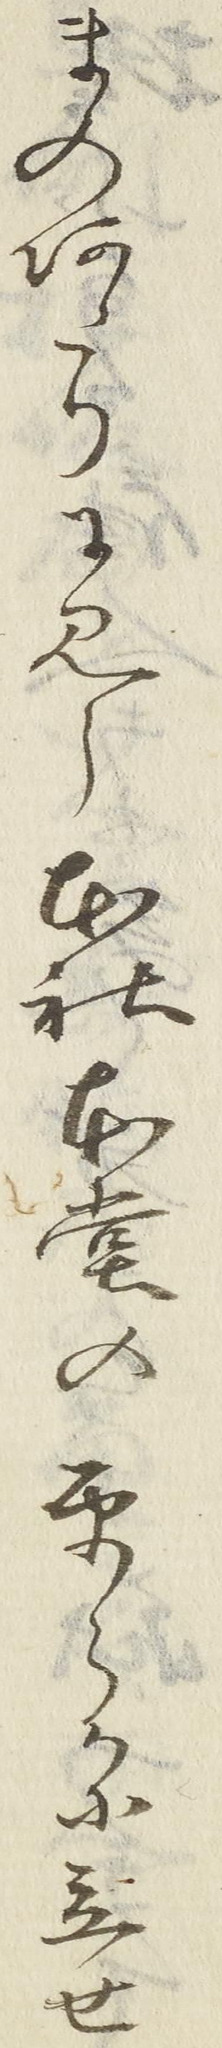まのあたりに見し本社本堂の平らかに立せ
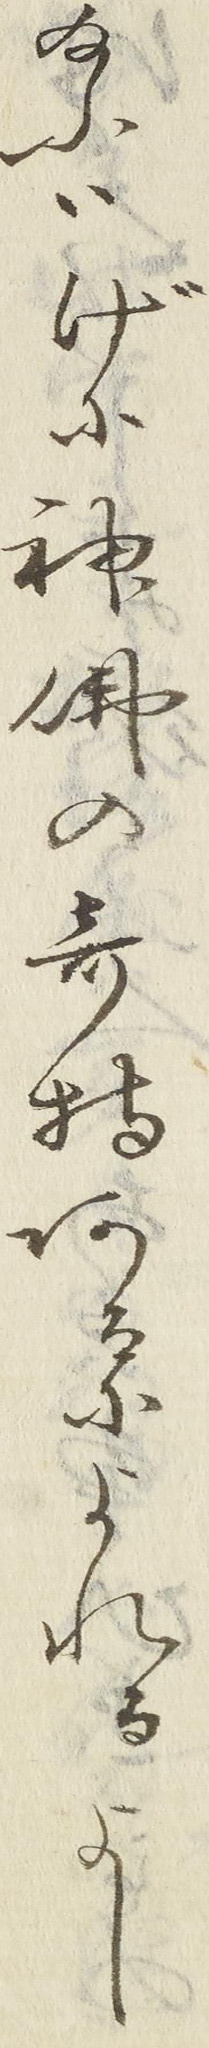給ふはげに神仏の奇特あるによれるよし
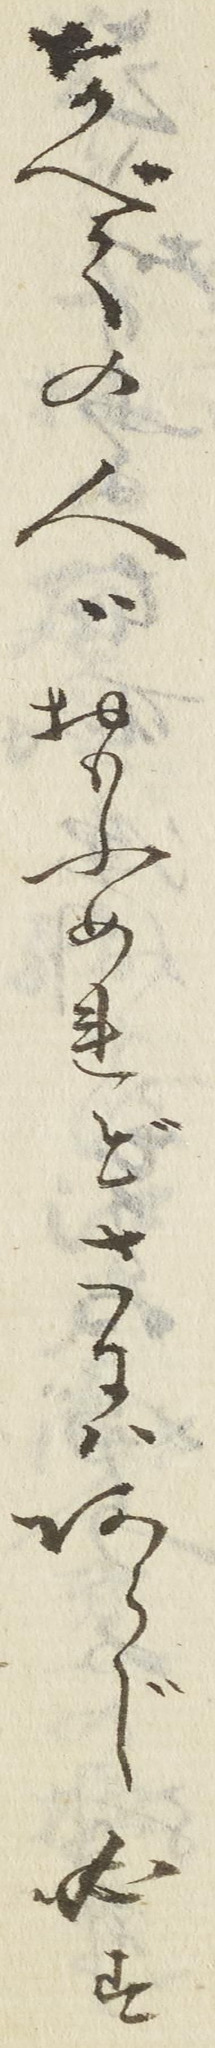なべての人はおもふめれどさにはあらじ必す
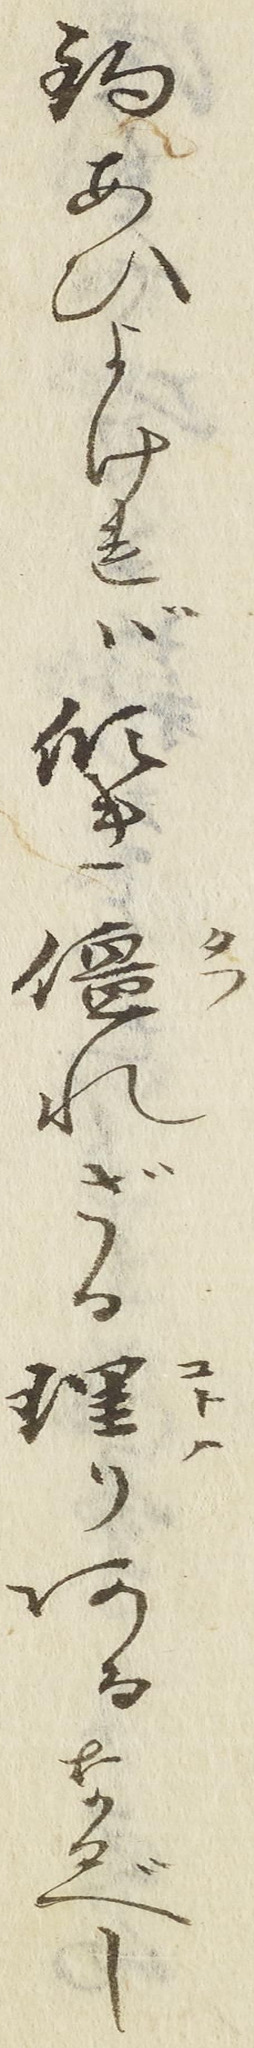釣あひよければ傾き僵れざる理りあるなるべし
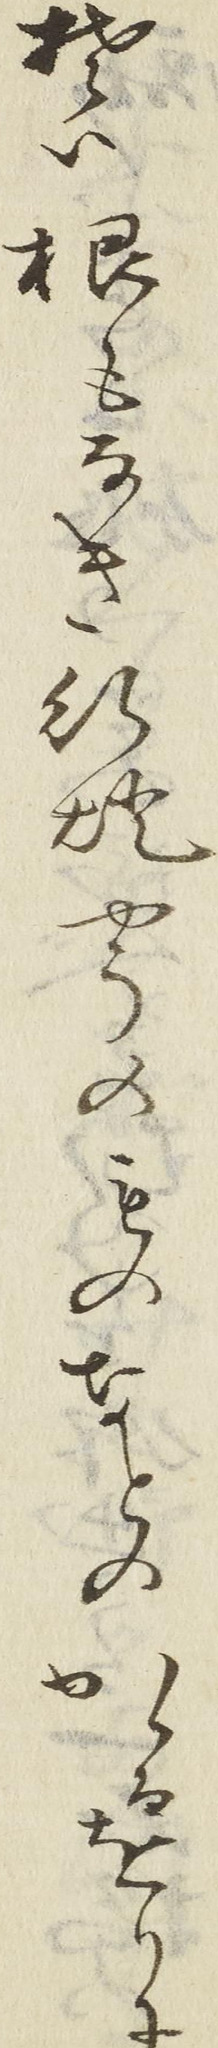そは根もなき行燈やうのものなとのかゝるをりに
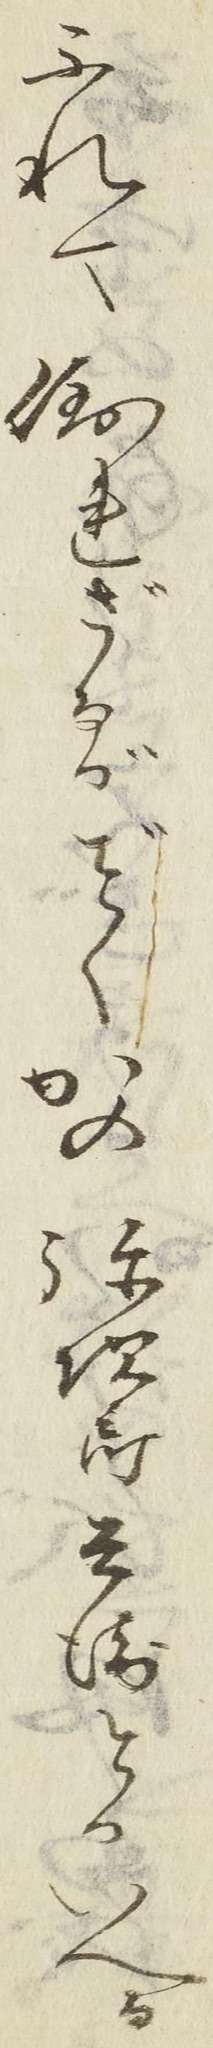ふれて倒れざるがごとくかの弥次郎兵衛とかいへる
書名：やぶれ窓の記　全
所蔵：東京大学地震研究所図書室 Earthquake Research Institute Library, The University of Tokyo, JAPAN
